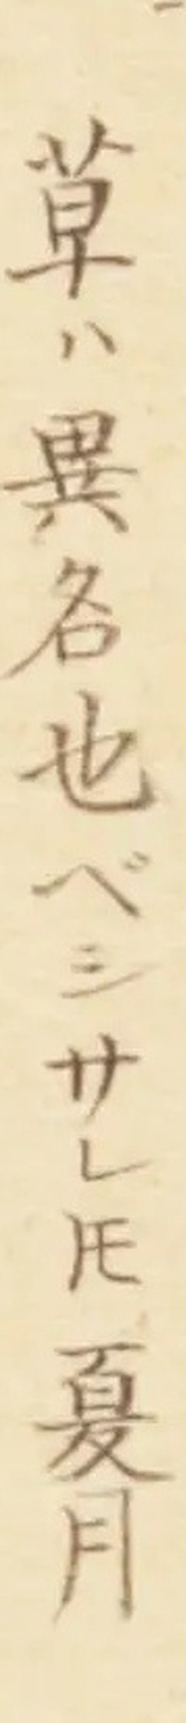草ハ異名也ベシサレトモ夏月
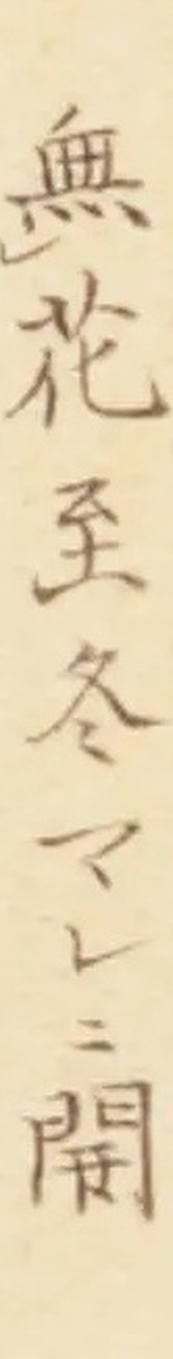無花冬至マレニ開
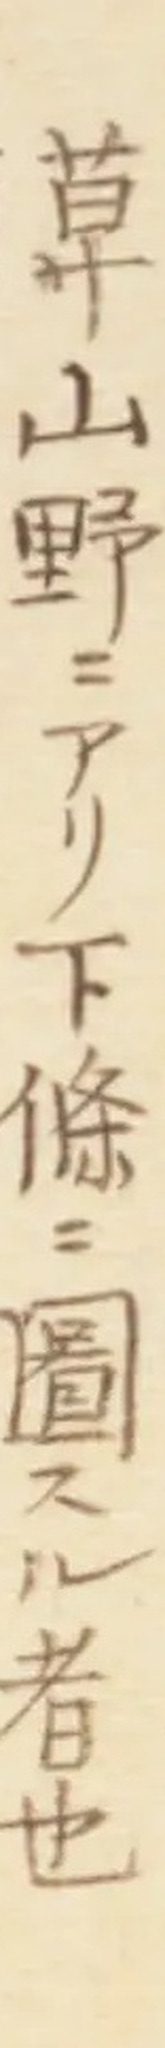草山野ニアリ下條ニ図スル者也
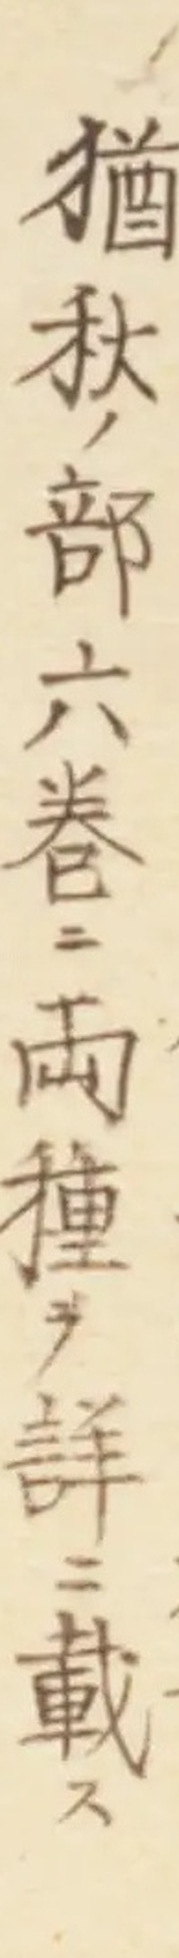猶秋ノ部六巻ニ両種ヲ詳ニ載ス
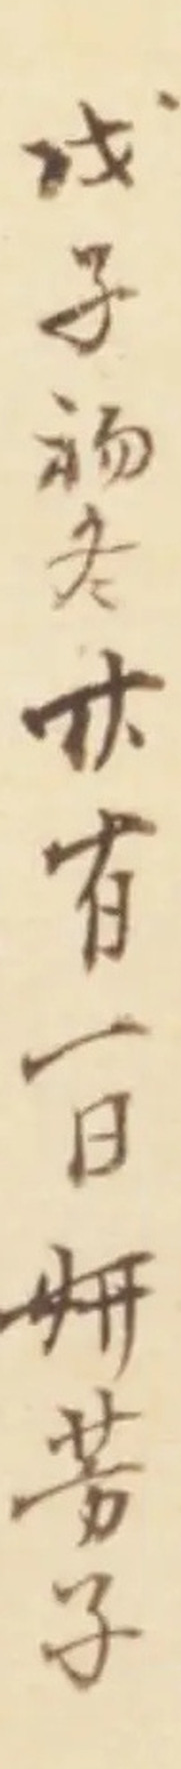戊子初冬廿有一日妍芳子
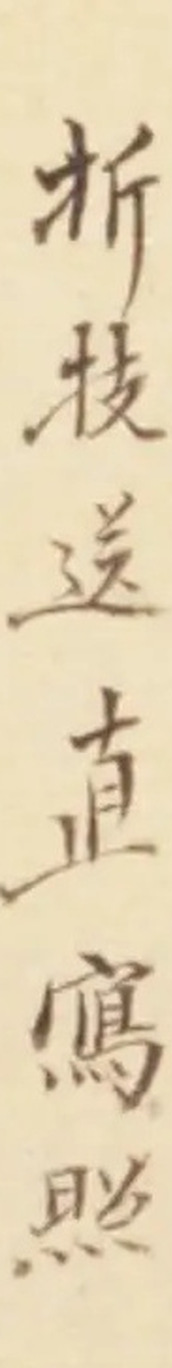折技送真写照
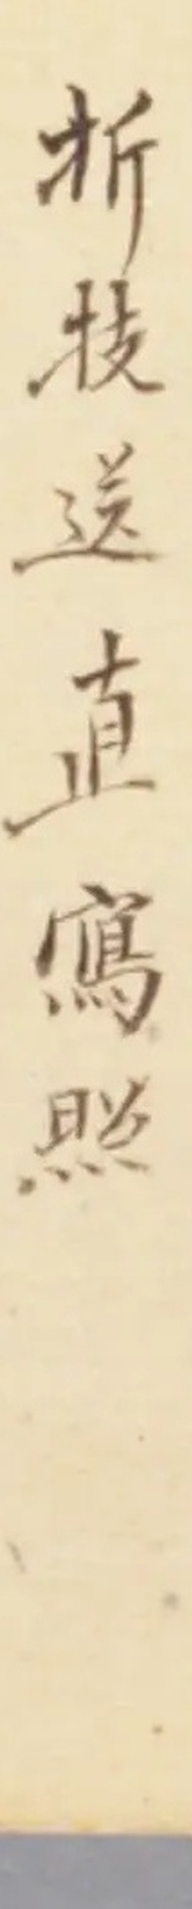折技送真写照

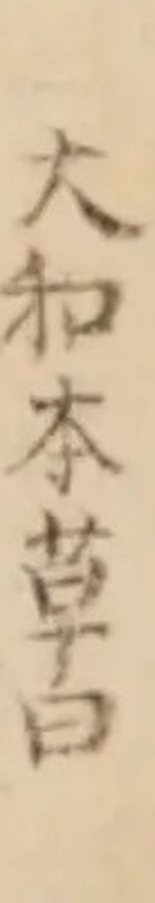大和本草曰
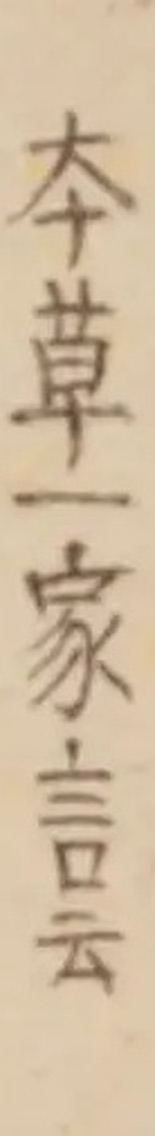本草一家言云
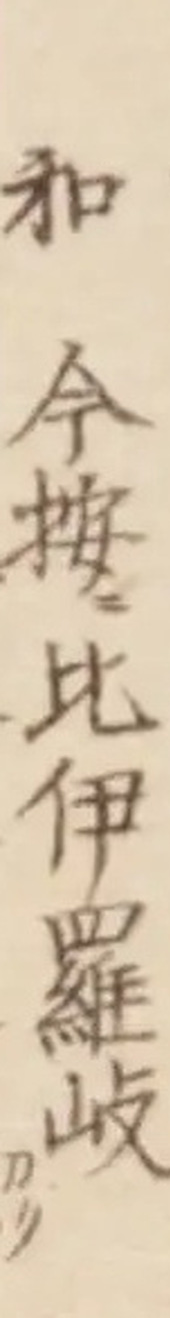和今按比伊羅岐
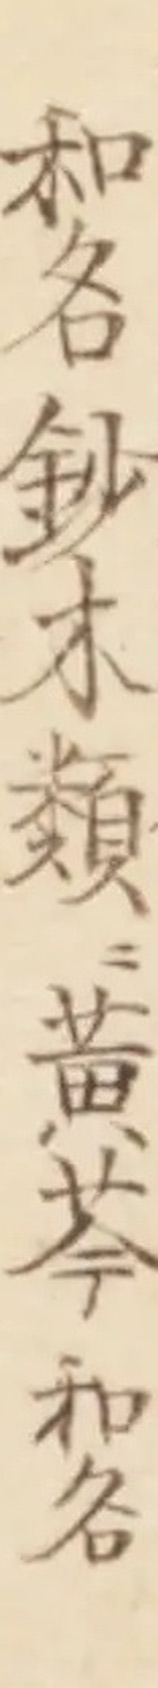和茗鈔木類黄芩和名
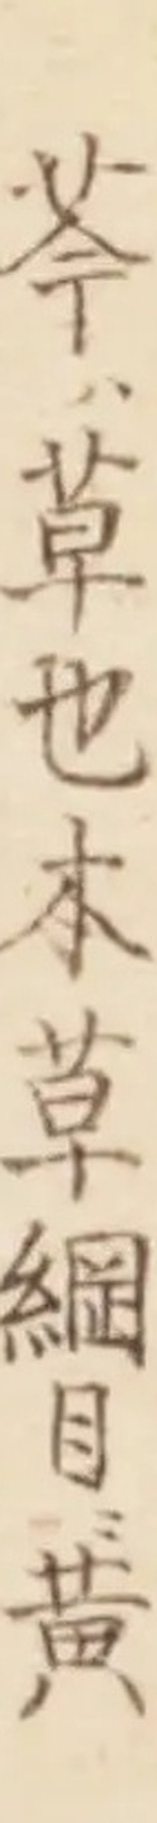芩草也本草綱目黄
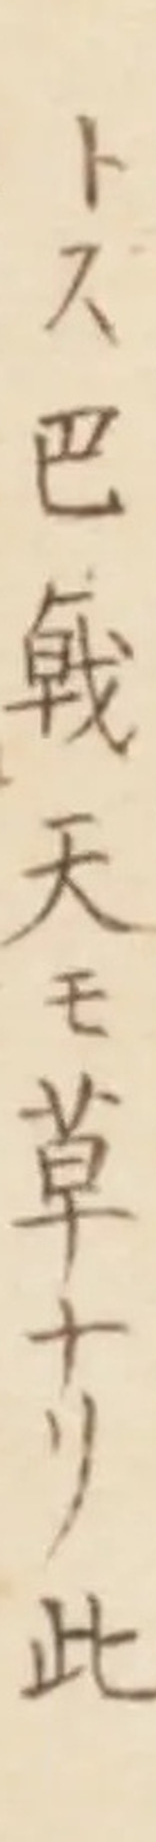トス巴戟天草ナリ此
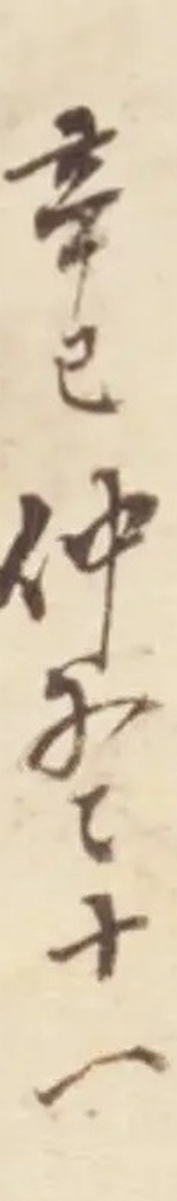辛己仲冬十一

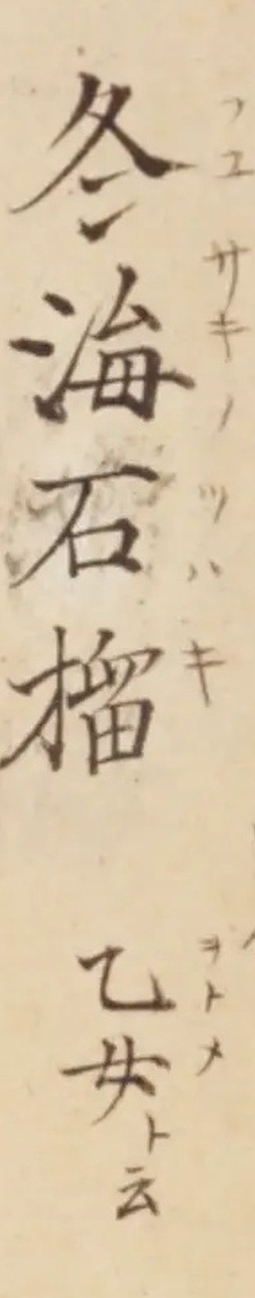冬海石榴乙女云
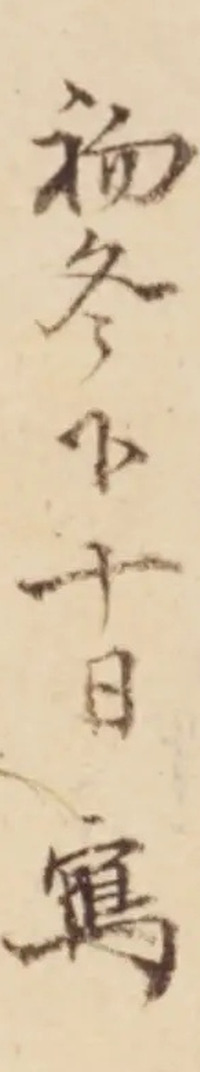初冬下十日写
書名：梅園草木花譜冬之部
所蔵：国立国会図書館 National Diet Library, JAPAN
